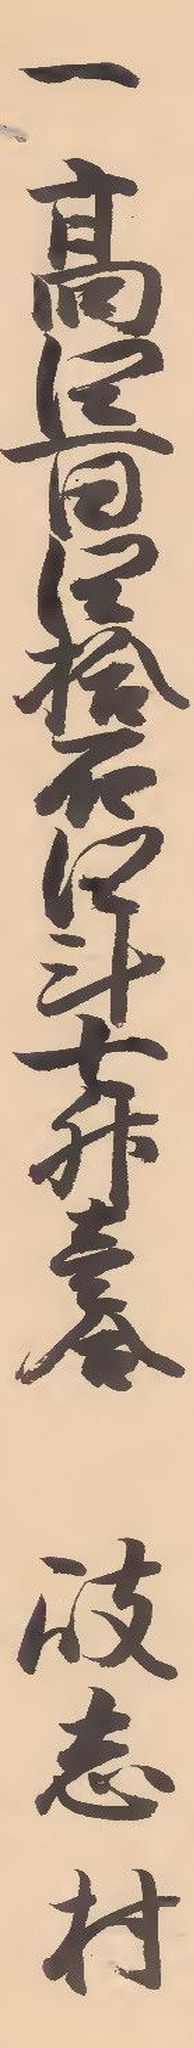一高四百四拾石四斗七升壱合岐志村

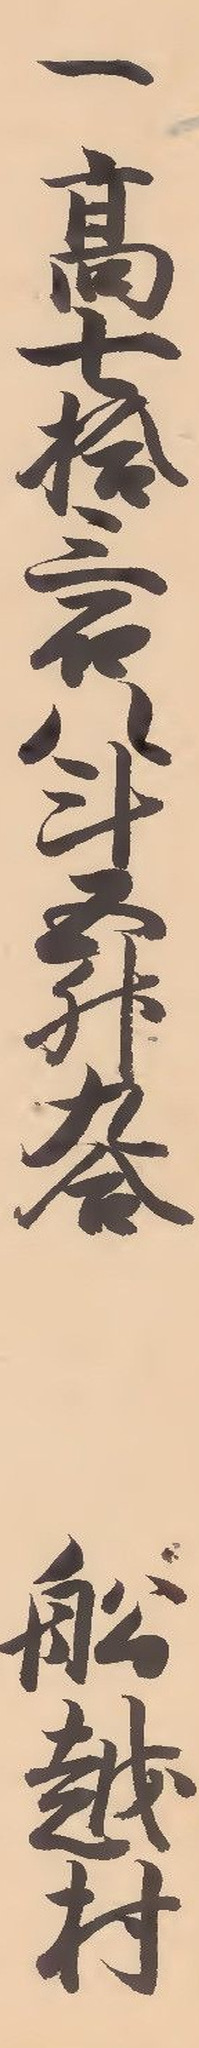一高七拾三石八斗五升九合船越村
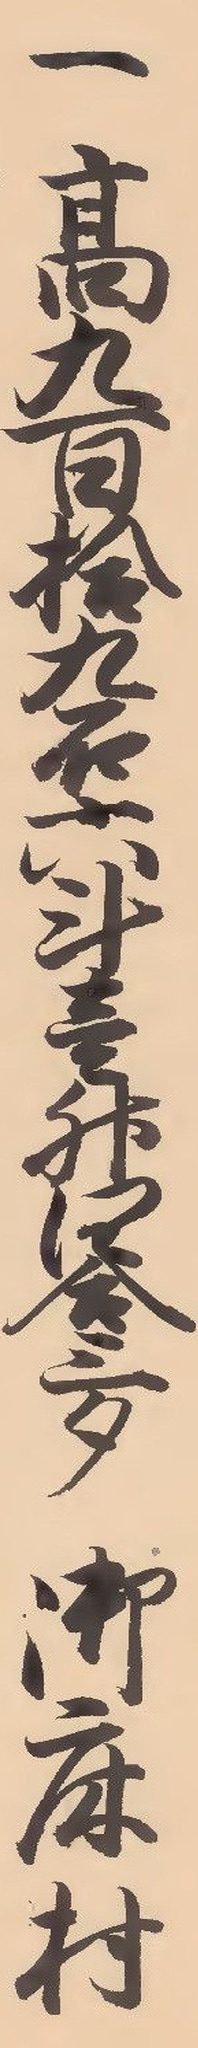一高九百拾九石六斗壱升四合三勺御床村
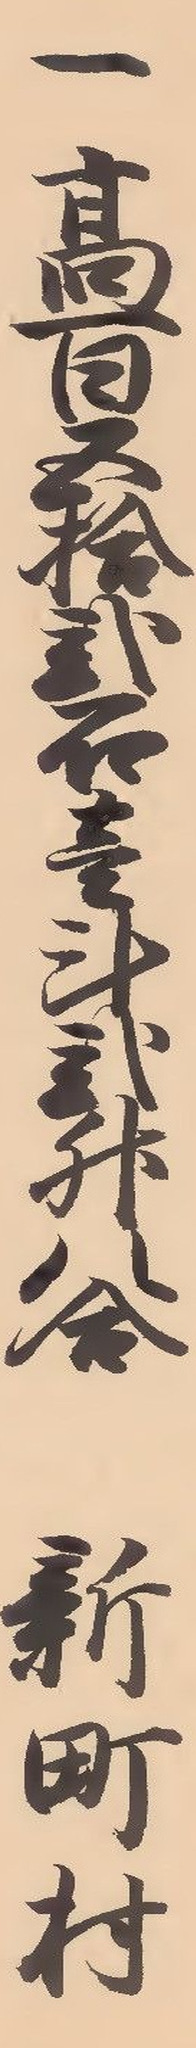一高百五拾弐石壱斗弐升八合新町村
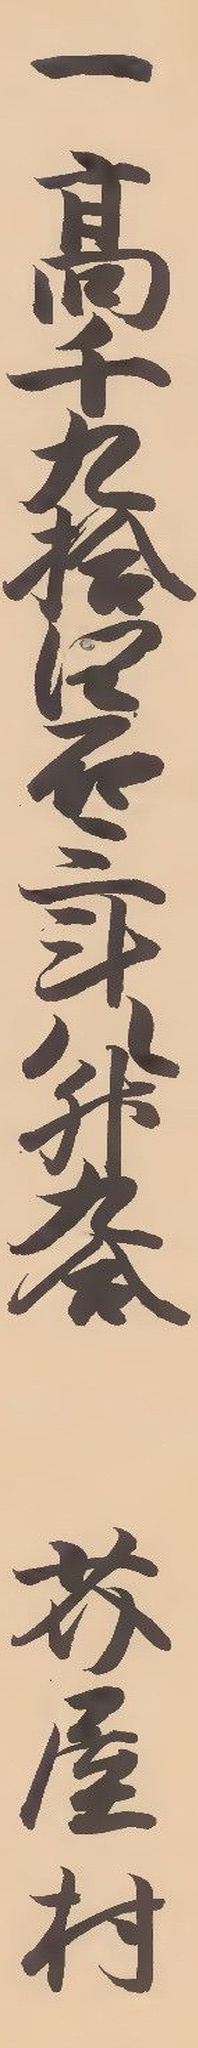一高千九拾四石三斗八升九合芥屋村
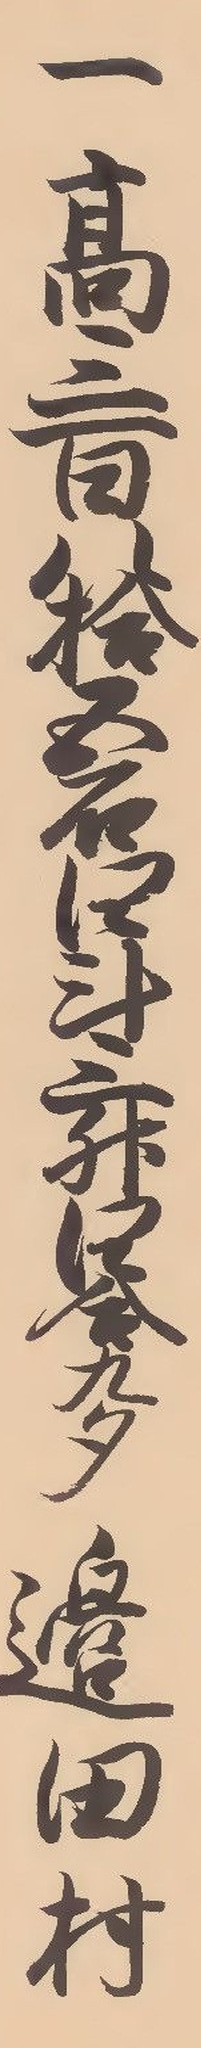一高三百八拾五石四斗三升四合九勺辺田村
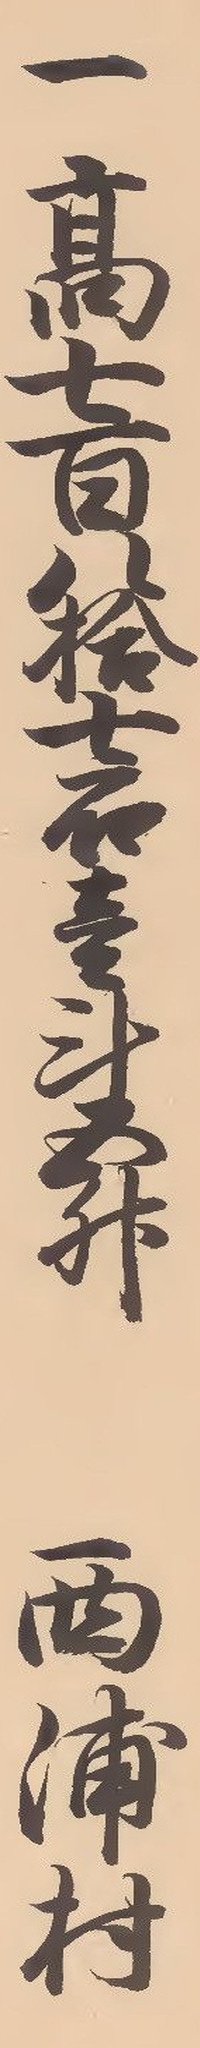一高七百八拾七石壱斗五升西浦村
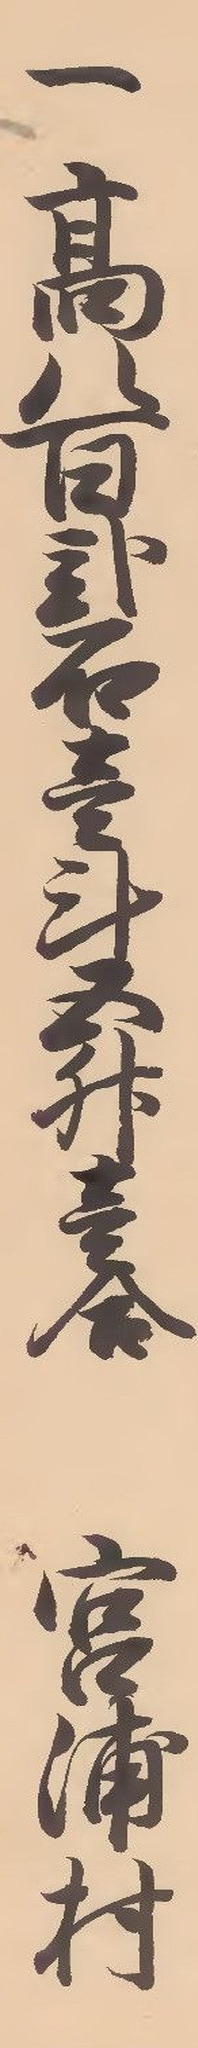一高八百弐石壱斗五升壱合宮浦村

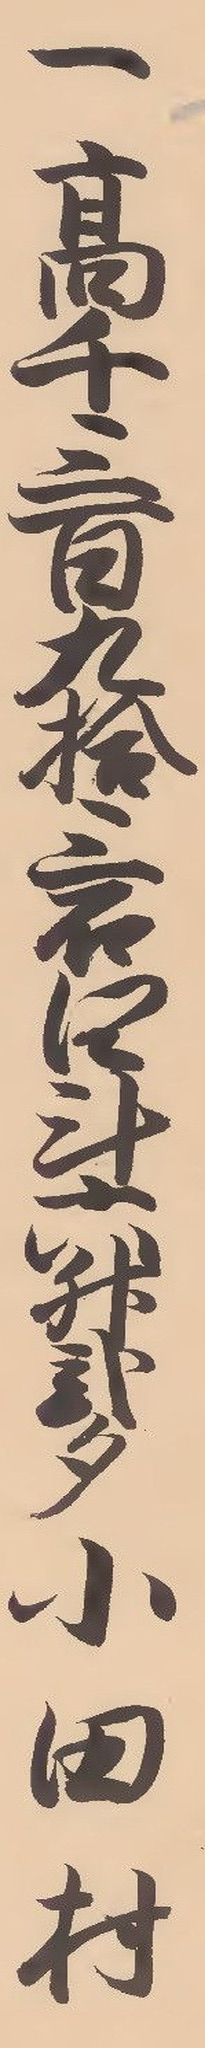一高千三百九拾三石四斗六升弐勺小田村
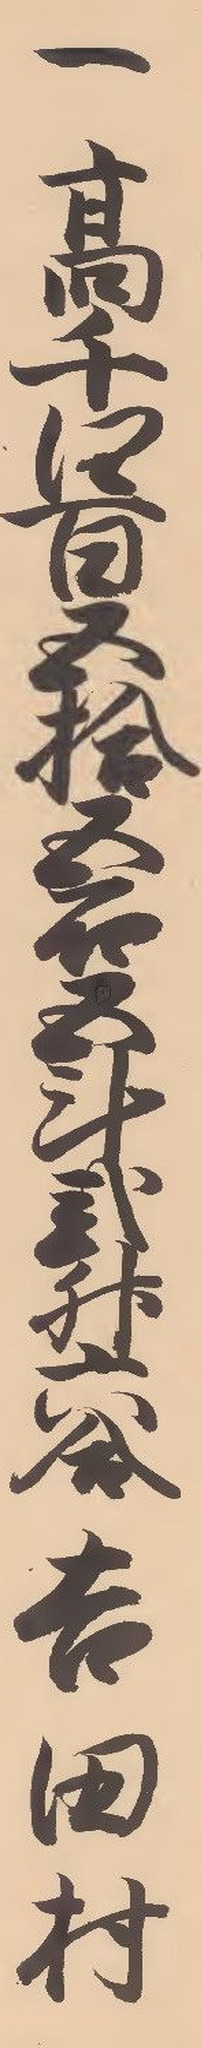一高千四百五拾五石五斗弐升六合吉田村
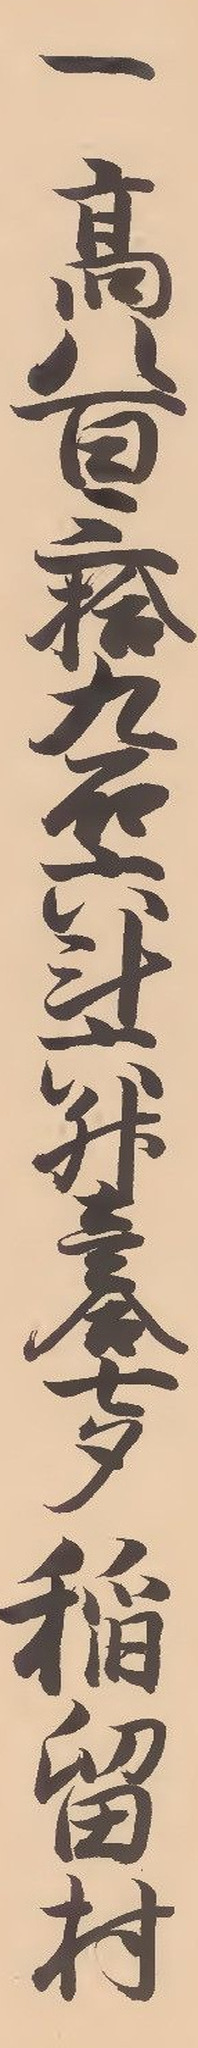一高八百三拾九石六斗六升壱合七勺稲留村
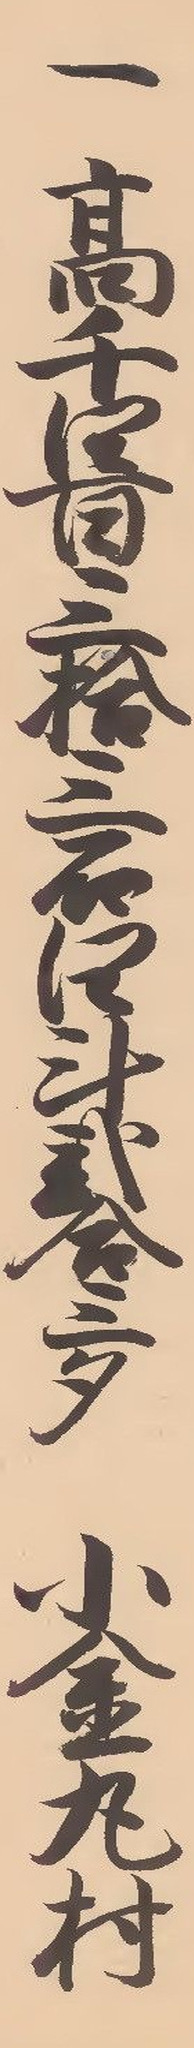一高千四百三拾三石四斗弐合三勺小金丸村
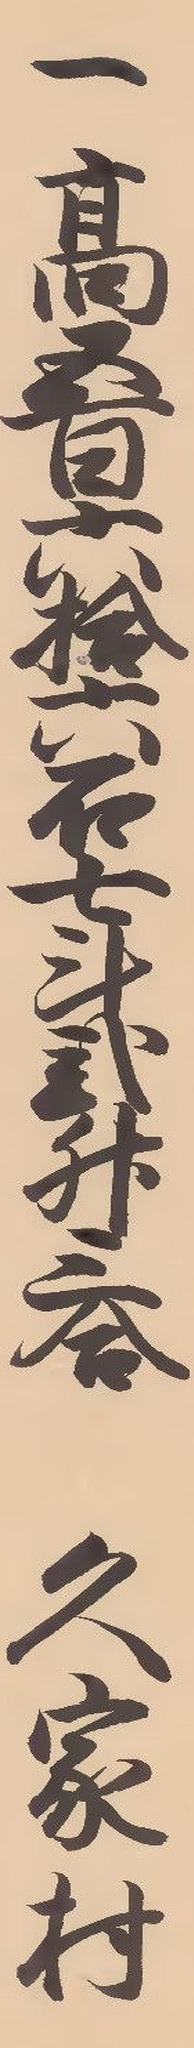一高五百六拾六石七斗弐升三合久家村
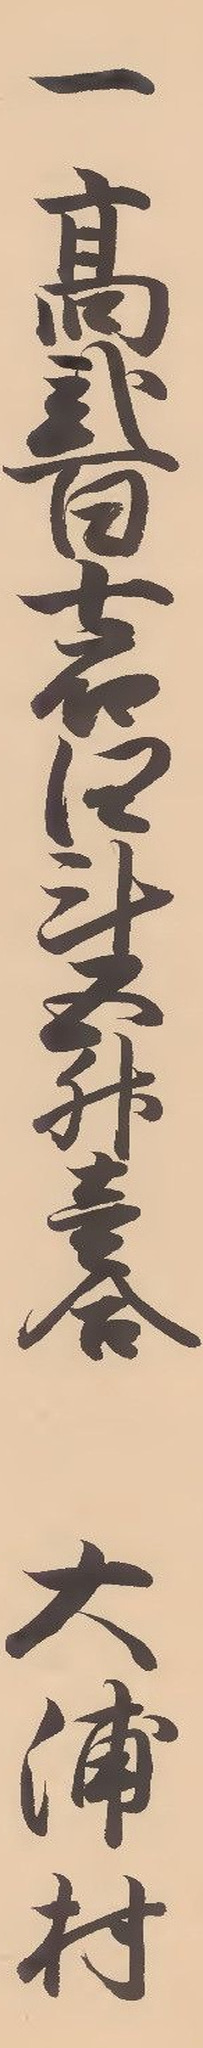一高弐百七石四斗五升壱合大浦村
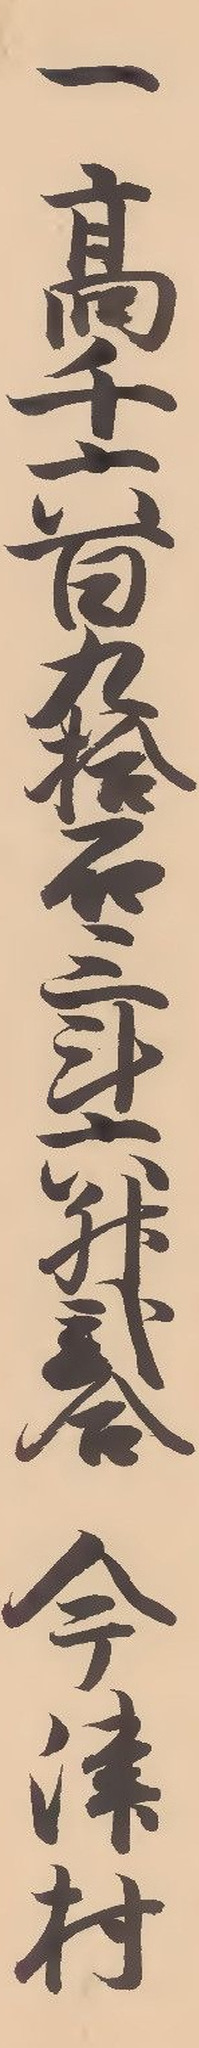一高千六百九拾石三斗六升弐合今津村
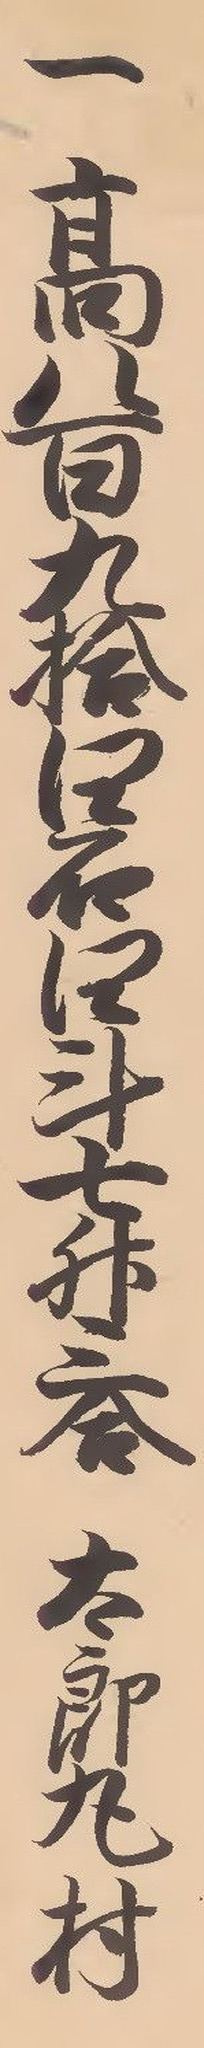一高八百九拾四石四斗七升三合太郎丸村
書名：筑前国郷帳
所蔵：国立公文書館 National Archives of Japan
